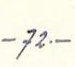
72
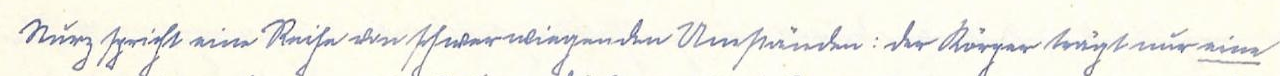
Sturz spricht eine Reihe von schwerwiegenden Umständen: der Körper trägt nur eine
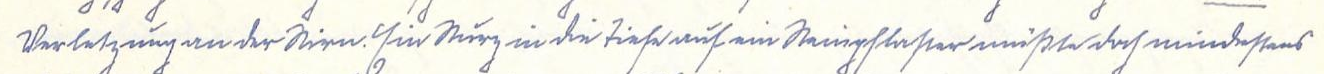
Verletzung an der Stirn. Ein Sturz in die Tiefe auf ein Steinpflaster müßte doch mindestens
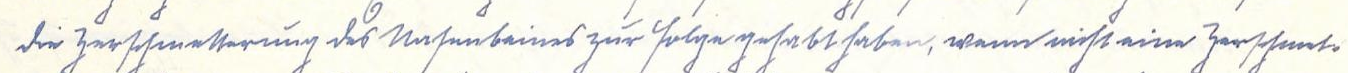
die Zerschmetterung des Nasenbeins zur Folge gehabt haben, wenn nicht eine Zerschmet-
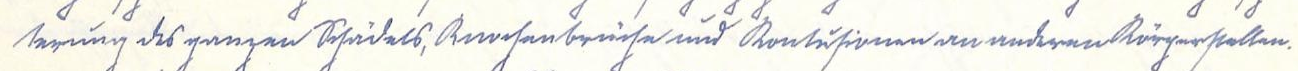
terung des ganzen Schädels, Knochenbrüche und Kontusionen an anderen Körperstellen.
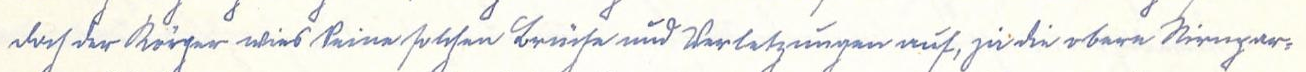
Doch der Körper wies keine solchen Brüche und Verletzungen auf, ja die obere Stirnpar-
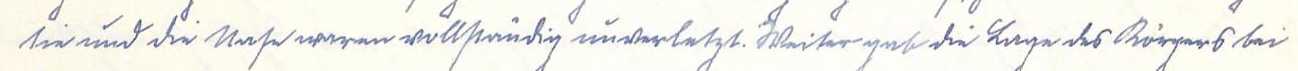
tie und die Nase war vollständig unverletzt. Weiter gab die Lage des Körpers bei
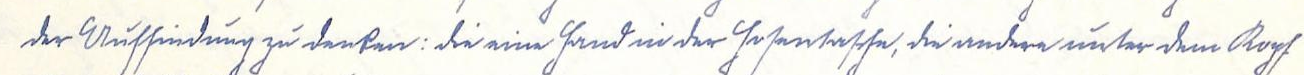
der Auffindung zu denken: die eine Hand in der Hosentasche, die andere unter dem Kopf
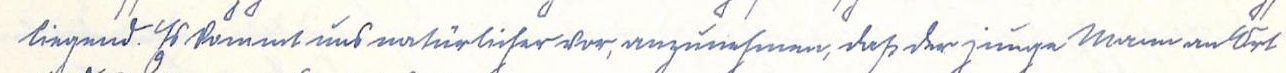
liegend. Es kommt uns natürlich hervor, anzunehmen, dass der junge Mann an Ort
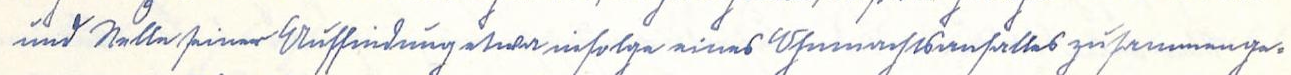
und Stelle seiner Auffindung etwa infolge eines Ohnmachtanfalles des zusammenge-
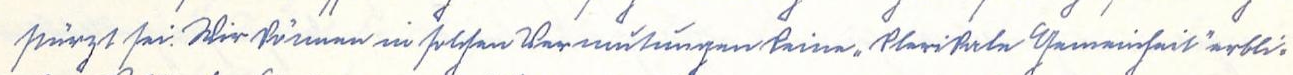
stürzt sei. Wir können in solchen Vermutungen keine “klerikale Gemeinheit“ erbli-
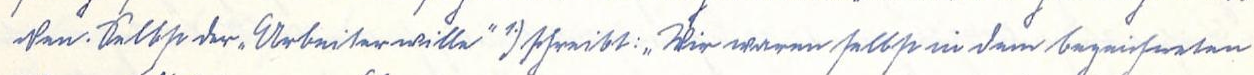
ken. Selbst der „Arbeiterwille“ 1) schreibt: Wir waren selbst in den bezeichneten
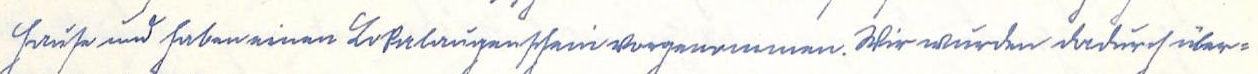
Hause und haben einen Lokalaugenschein vorgenommen. Wir wurden dadurch über-
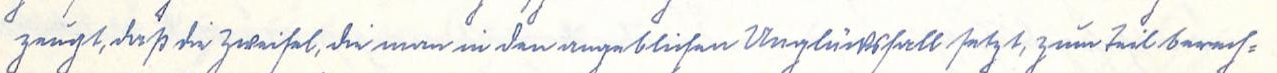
zeugt, daß die Zweifel, die man in den angeblichen Unglücksfall setzt, zum Teil berech-
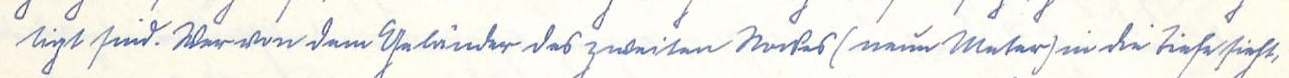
tigt sind. Wer von dem Gelände des zweiten Stockes (9 Meter) in die Tiefe sieht,
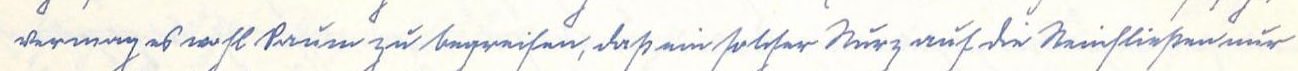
vermag es wohl kaum zu begreifen, dass ein solcher Sturz auf die Steinfliesen nur
